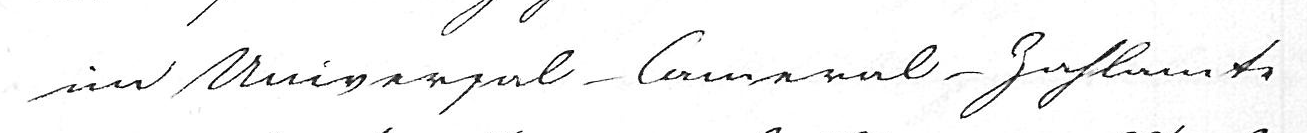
im Universal-Cameral-Zahlamte
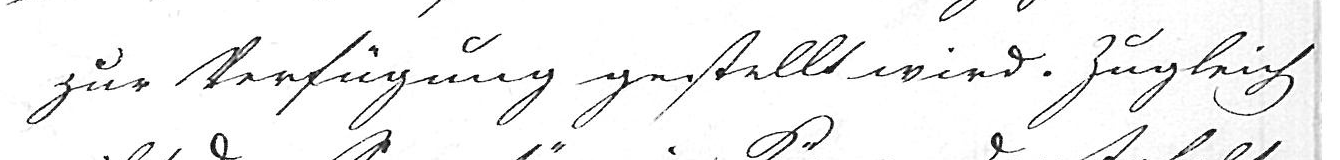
zur Verfügung gestellt wird. Zugleich
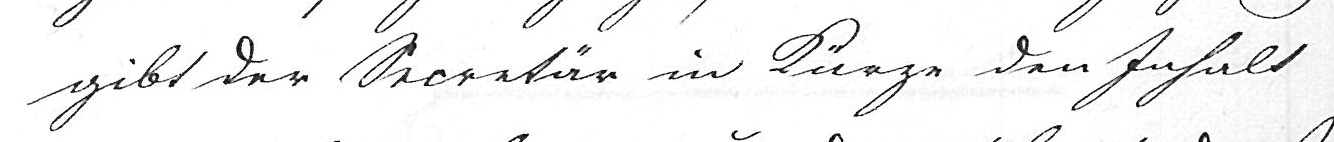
gibt der Secretär in Kürze den Inhalt
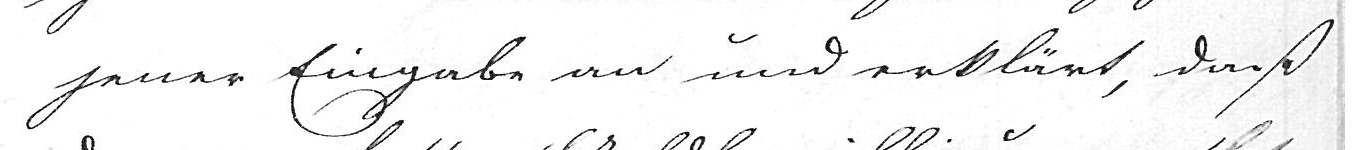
jener Eingabe an und erklärt, daß
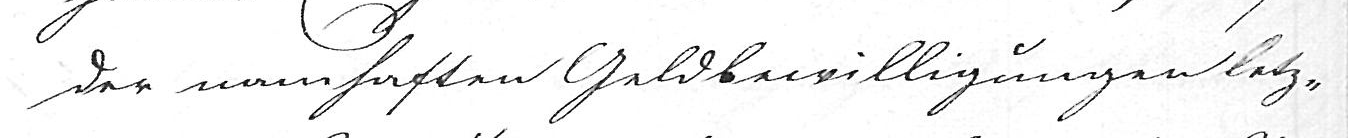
der namhaften Geldbewilligungen letz-
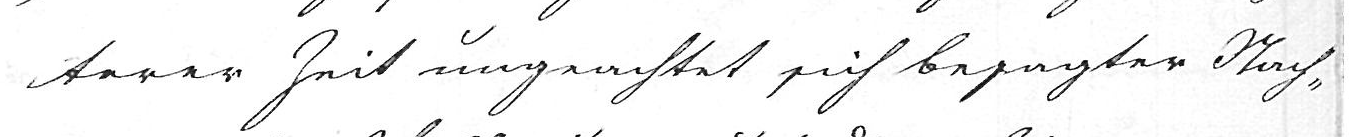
terer Zeit ungeachtet sich besagter Nach-
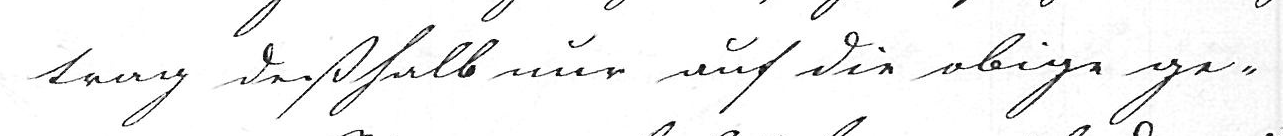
trag deßhalb nur auf die obigen ge-
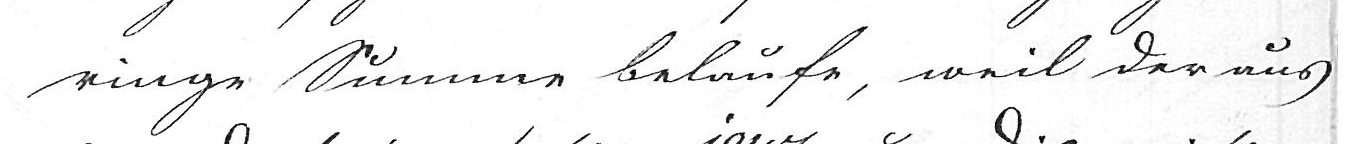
ringe Summe belaufe weil der aus
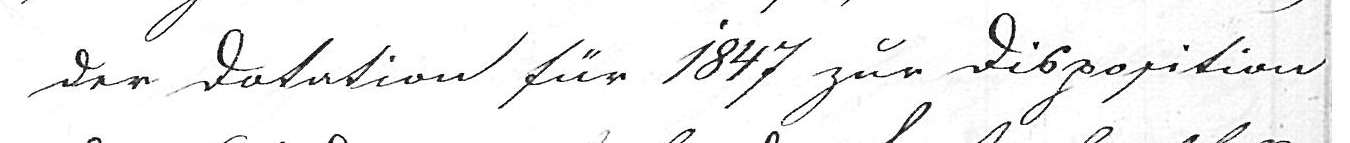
der Dotation für 1847 zur Disposition
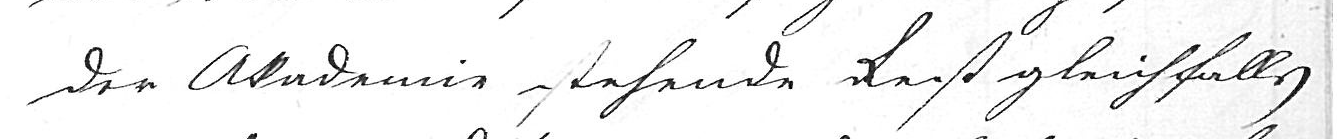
der Akademie stehenden Rest gleichfalls
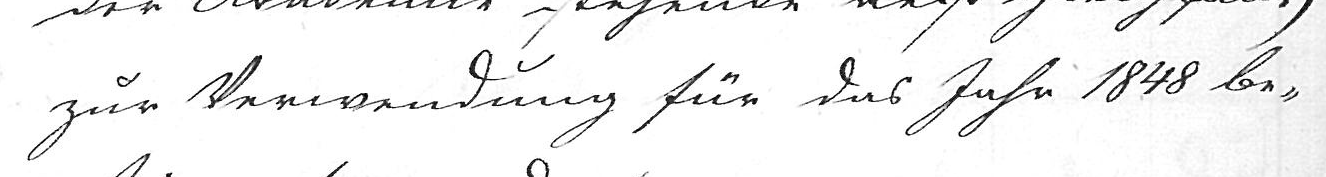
zur Verwendung für das Jahr 184 be-
